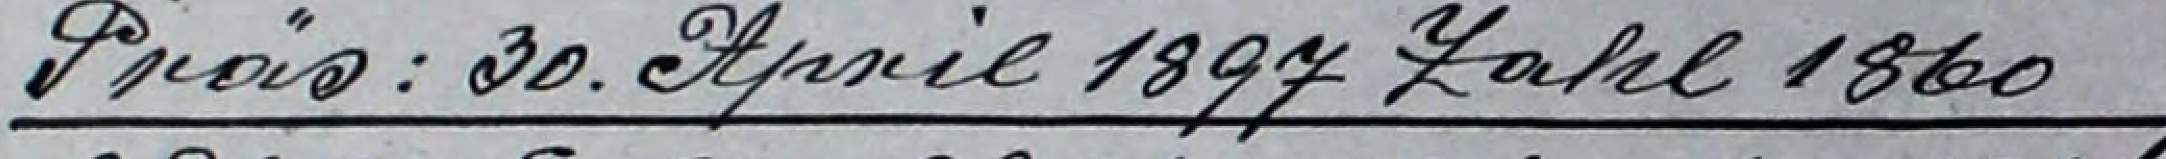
Präs: 30. April 1897 Zahl 1860
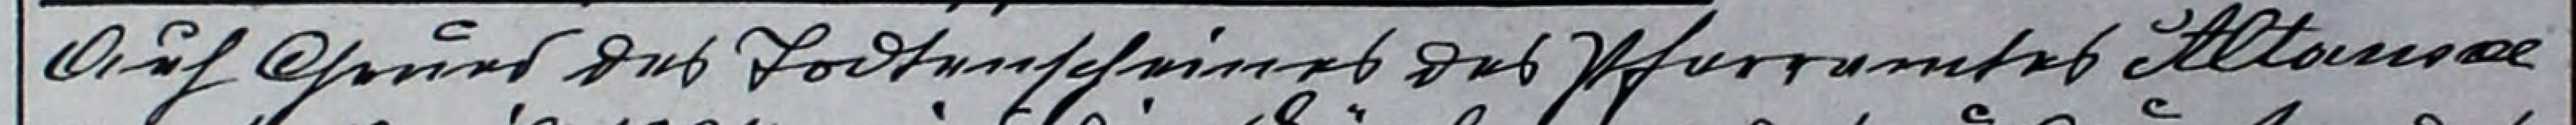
Auf Grund des Todtenscheines des Pfarramtes Altaussee
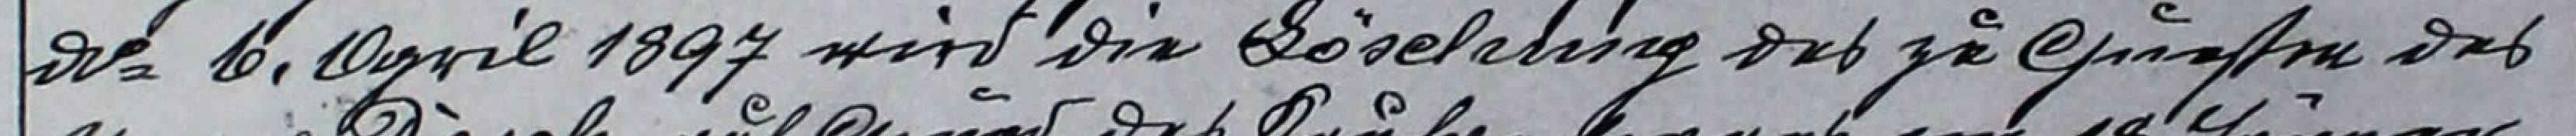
ddo 6. April 1897 wird die Löschung des zu Gunsten des
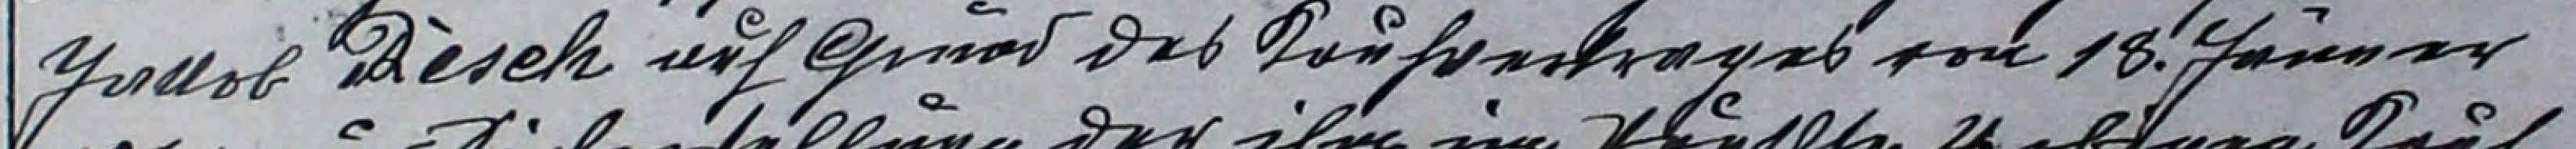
Jakob Desch auf Grund des Kaufvertrages von 18. Jänner
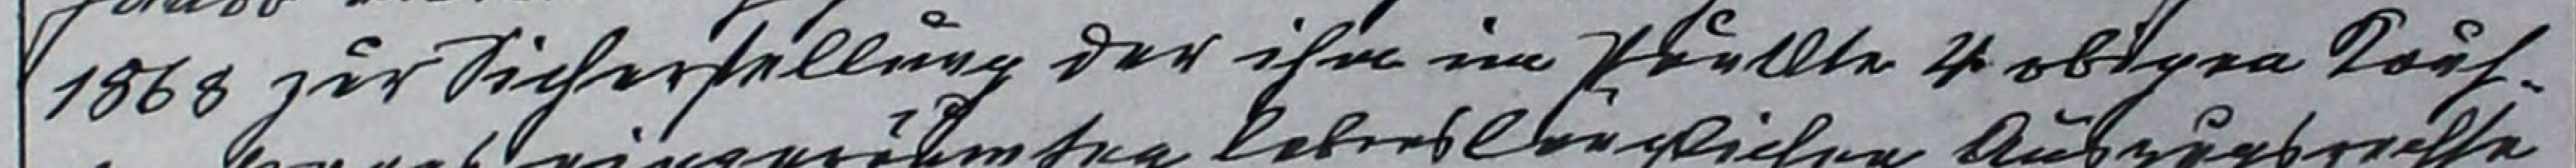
1868 zur Sicherhellung der ihm in Punkte 4 obigen Kauf„
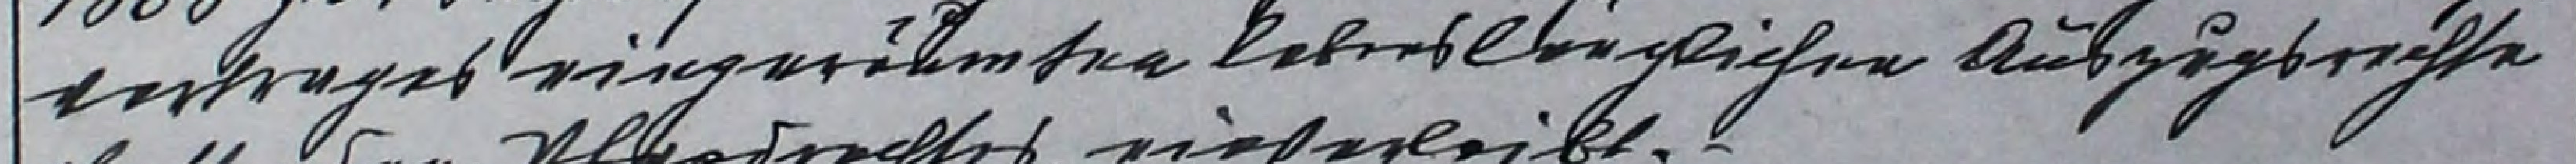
vertrages eingeräumten lebenslänglichen Auszugsrechte
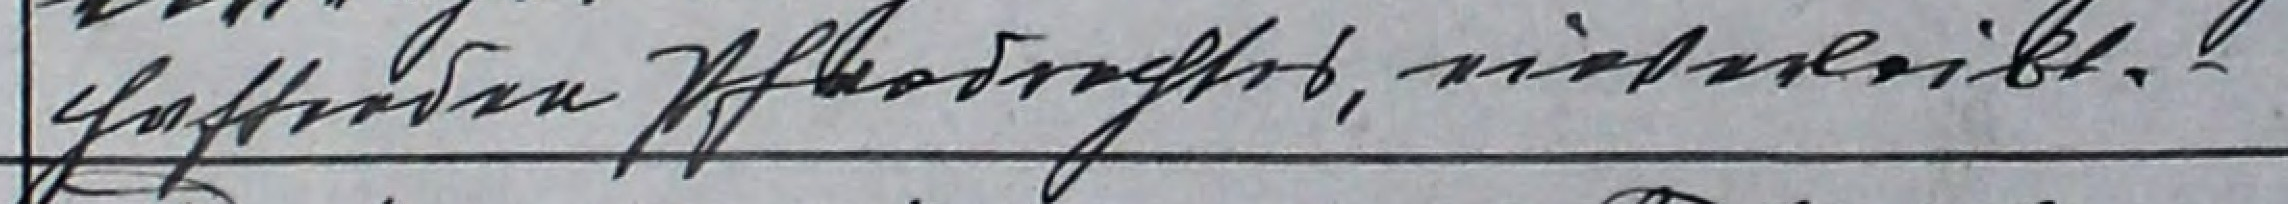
haftenden Pfandrechtes, einverleibt.
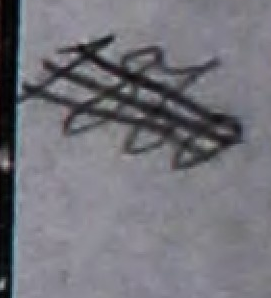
1860
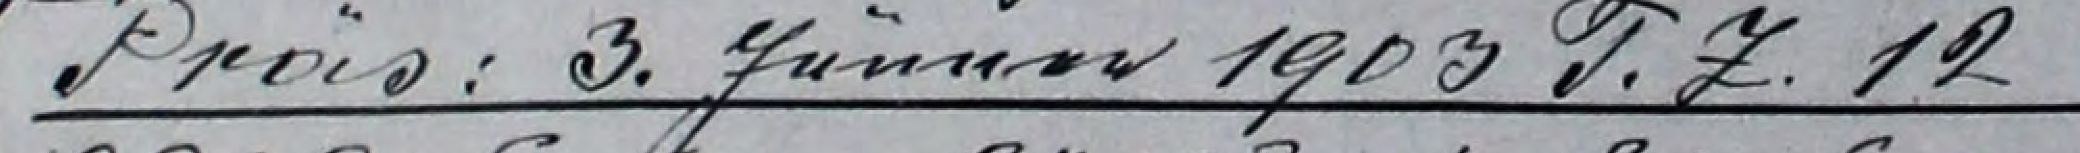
Präs: 3. Jänner 1903 T.Z. 12
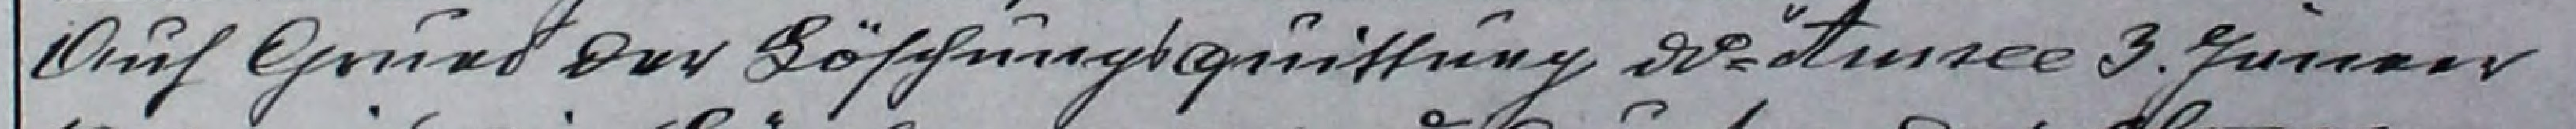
Auf Grund der Löschungsquittung ddo Aussee 3. Jänner
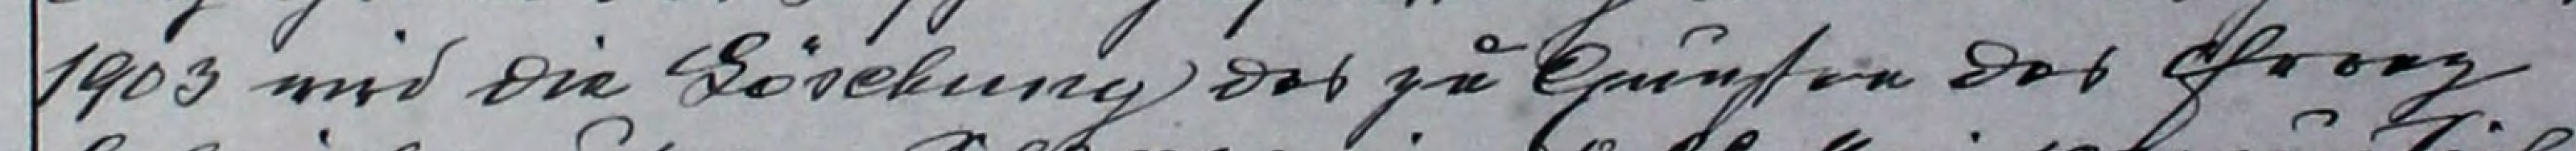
1903 wird die Löschung des zu Gunsten des Franz
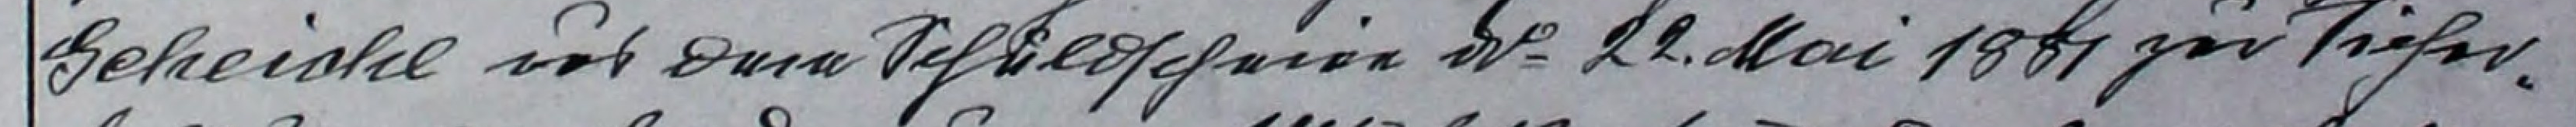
Scheichl aus dem Schuldscheine ddo 22. Mai 1881 zur Sicher„
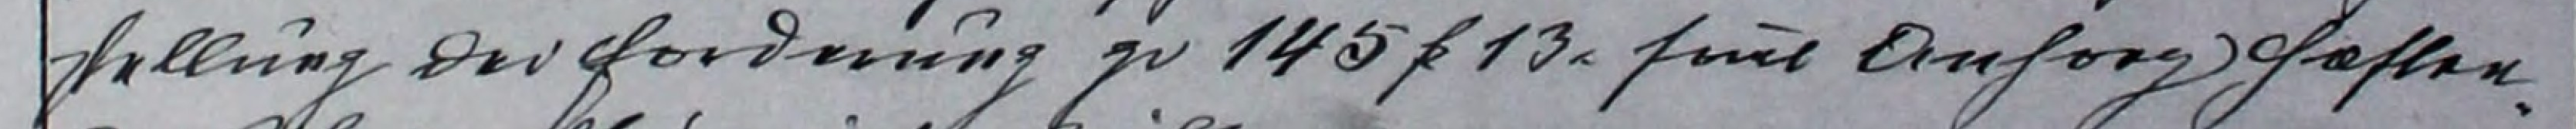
stellung der Forderung pr 145 f 13 ? sammt Anhang Hassen„
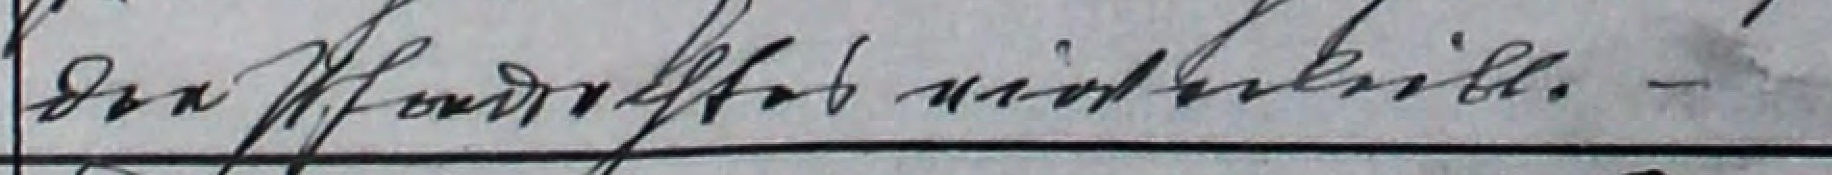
den Pfandrechtes einverleibt.
